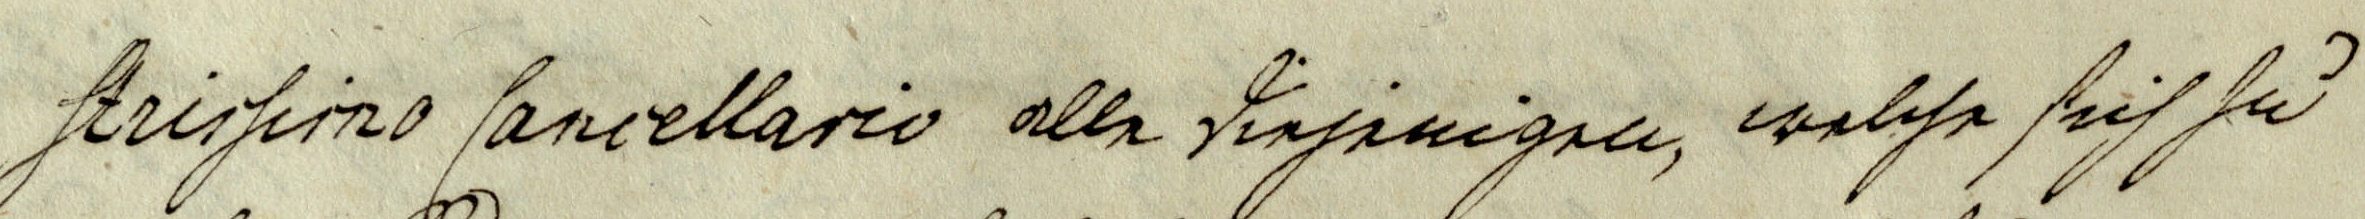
strissimo Cancellario alle diejenigen, welche sich zu
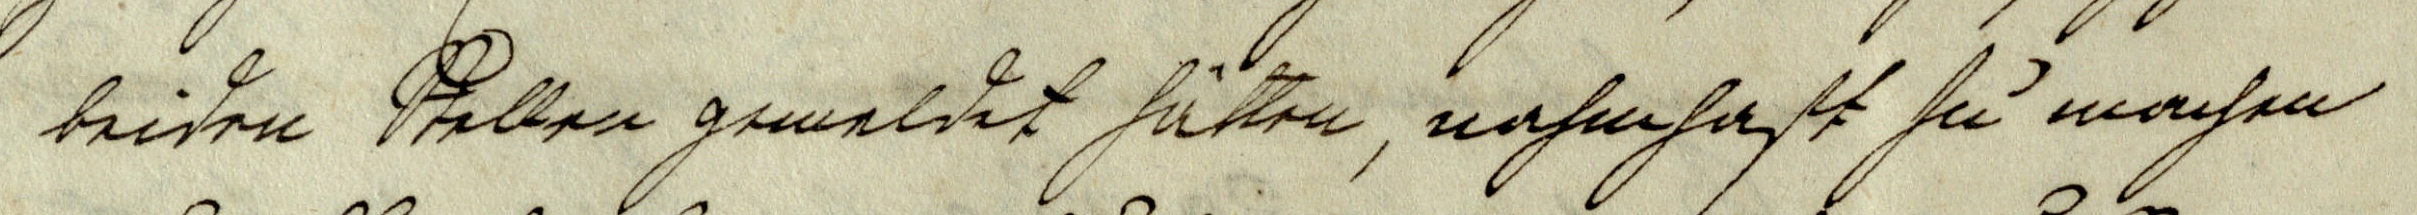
beiden Stellen gemeldet hätten, nahmhaft zu machen
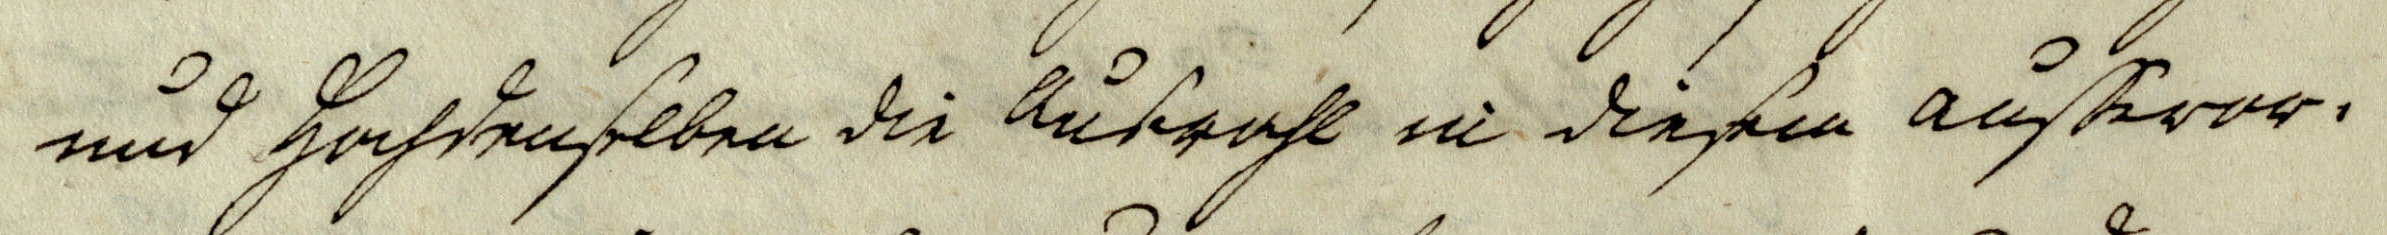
und Hochdenselben die Auswahl in diesem ausseror¬
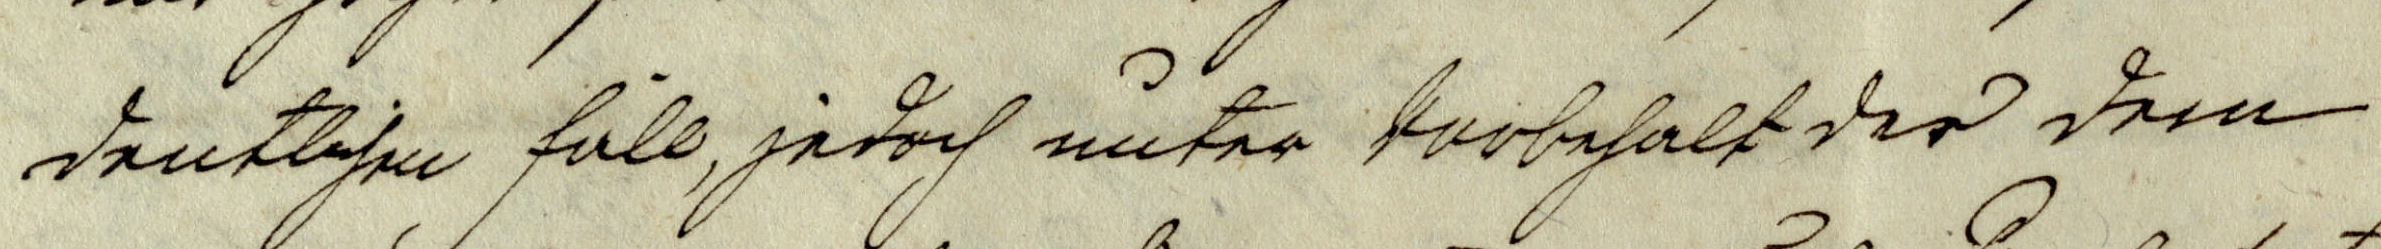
dentlichen Fall, jedoch unter Vorbehalt des dem
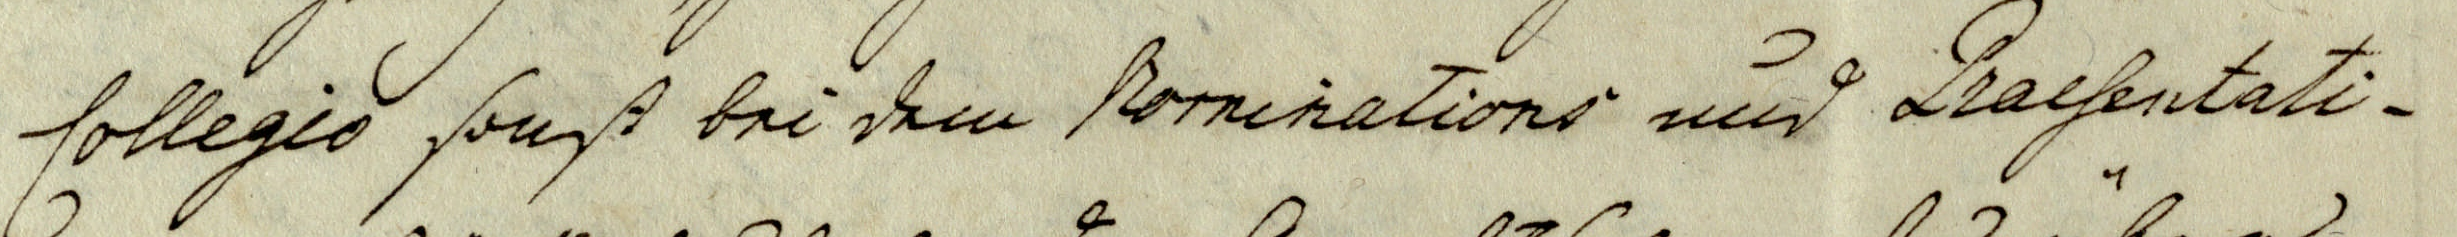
Collegio sonst bei dem Nominations und Praesentati¬
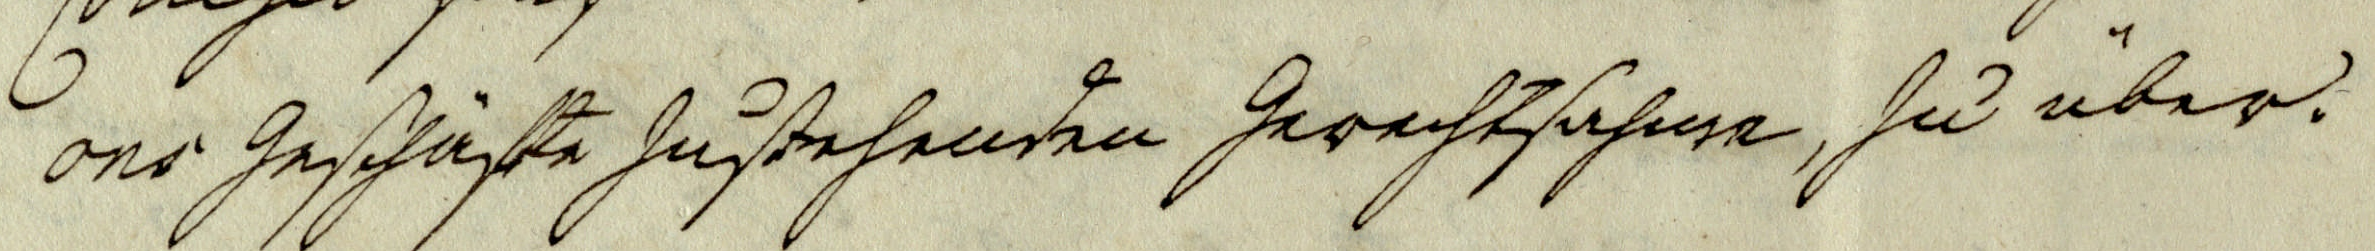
ons Geschäfte zustehenden Gerechtsahme, zu über¬
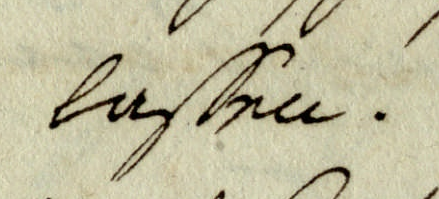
lassen.
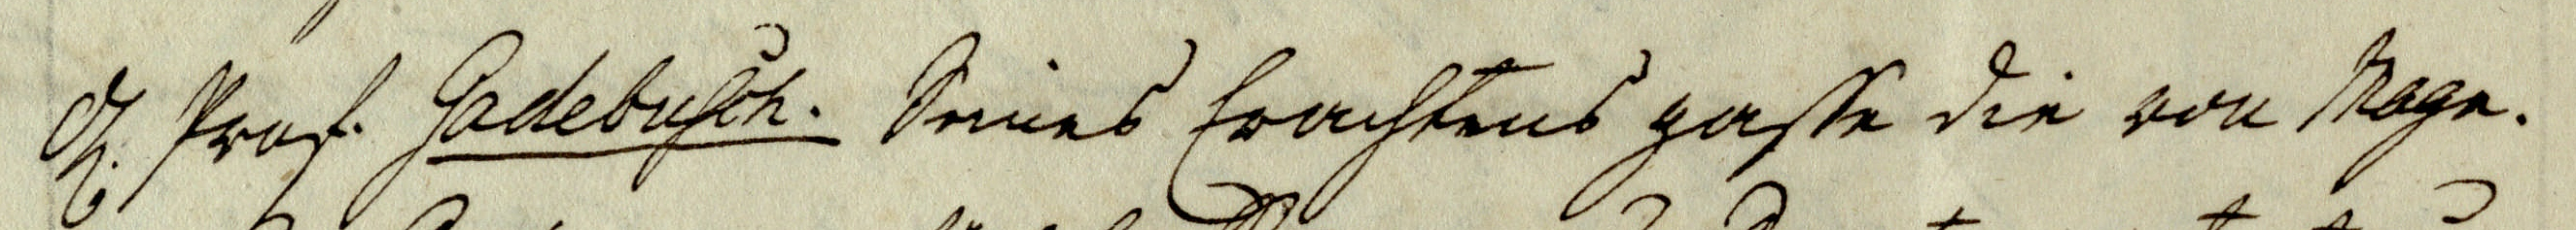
dh. Prof. Gadebusch. Seines Erachtens passe die von Magn.
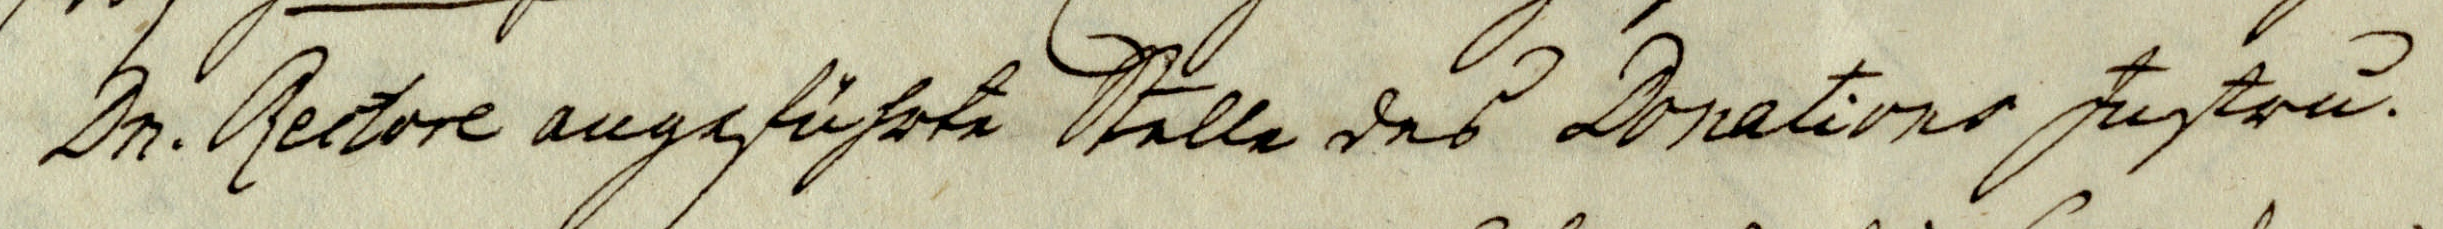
Dn. Rectore angeführte Stelle des Donations Instru¬
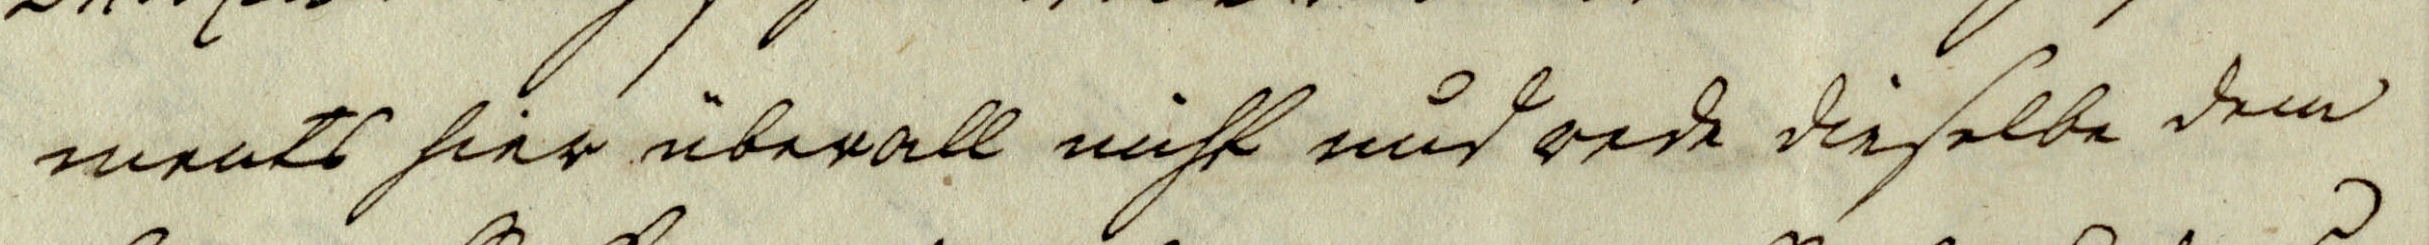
ments hier überall nicht und rede dieselbe dem
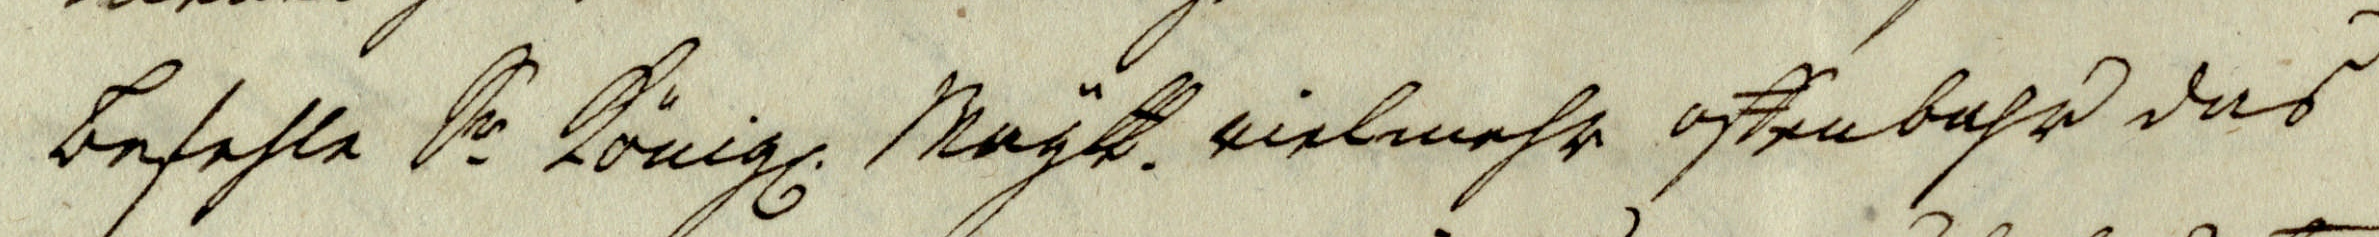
Befehle Sr. Königl. Maÿst. vielmehr offenbahr das
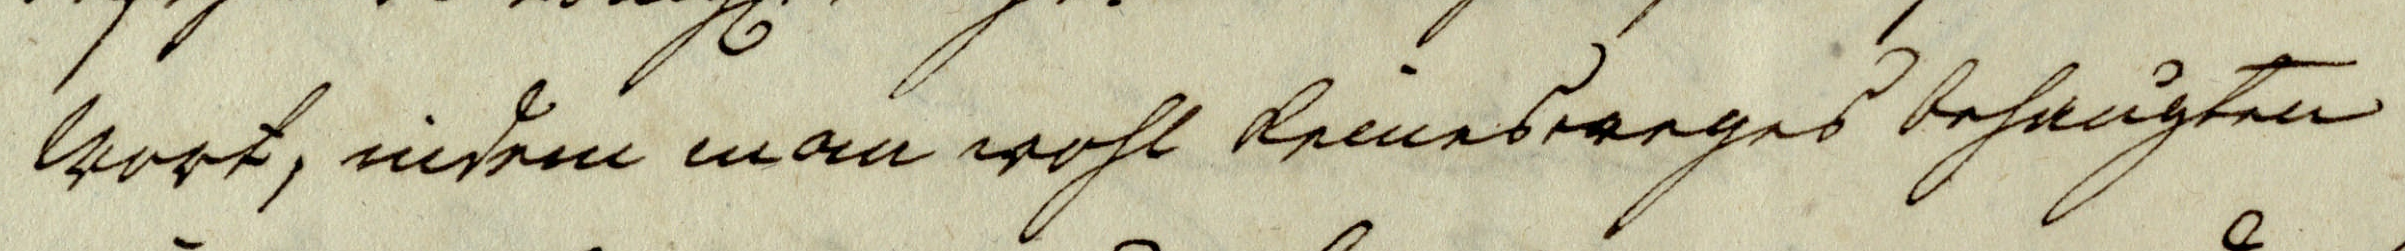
Wort, indem man wohl keinesweges behaupten
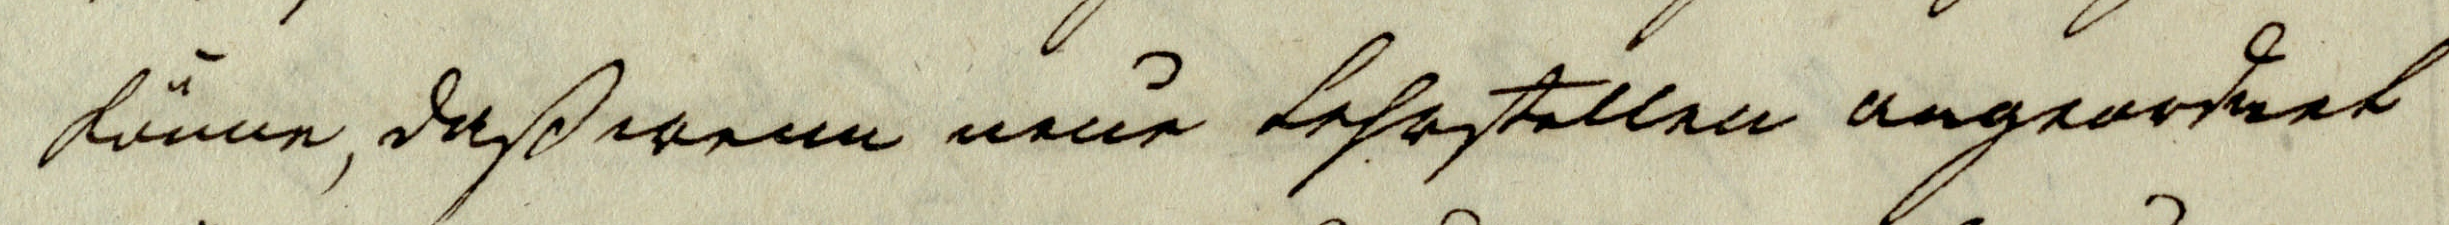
könne, daß wenn nur Lehrstellen angeordnet
